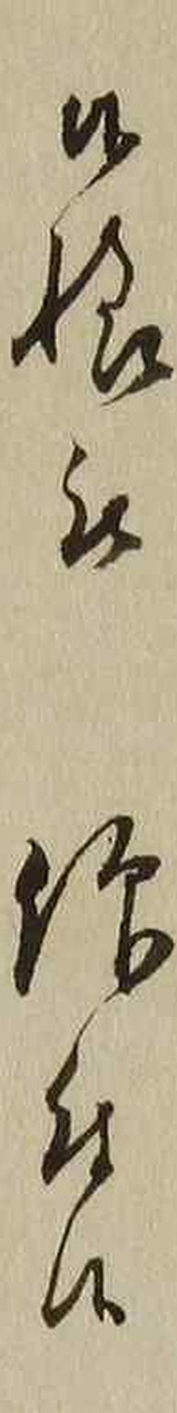候様被仰付候
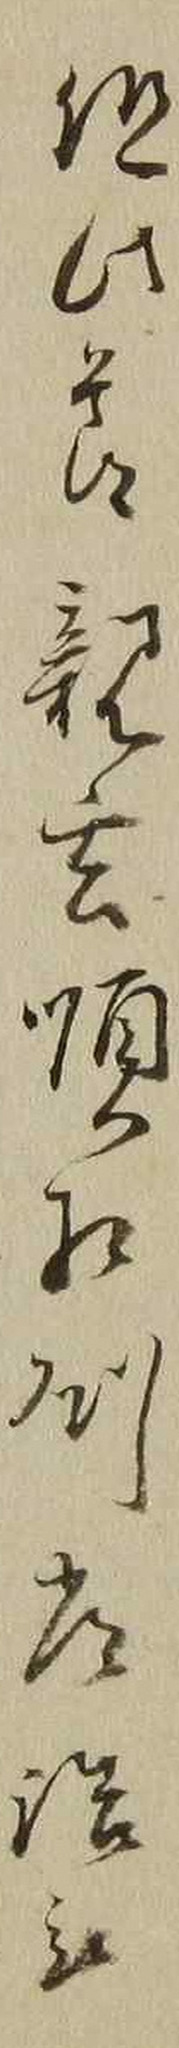但此節親玄順相州常詰被
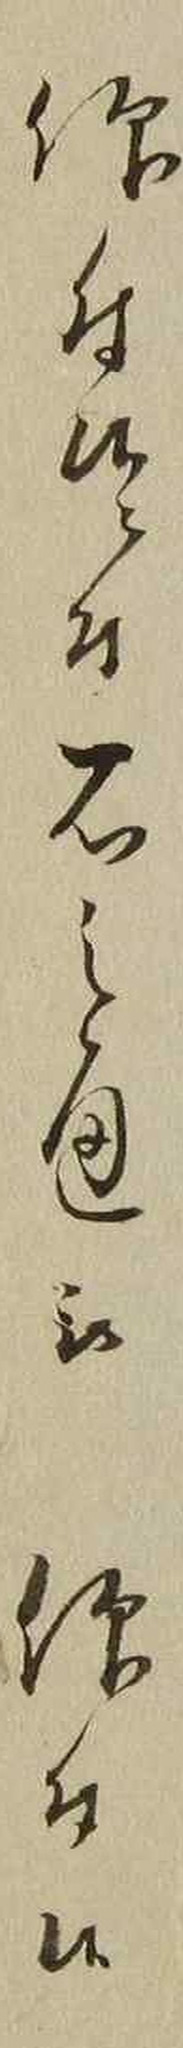仰付候ニ付右之通被仰付候
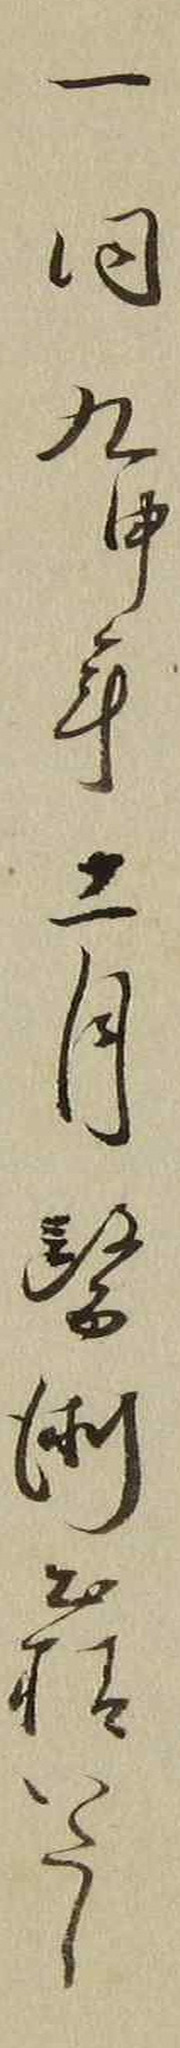一同九申年十一月医術出精いたし
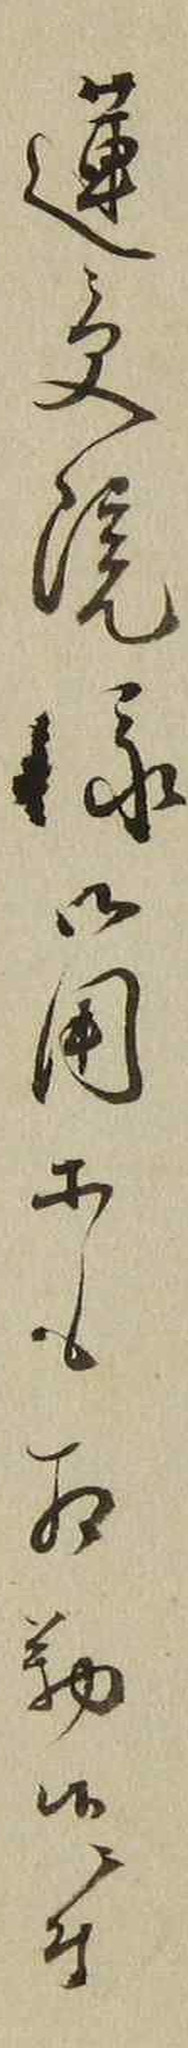蓮受院様御用等も相勤候ニ付
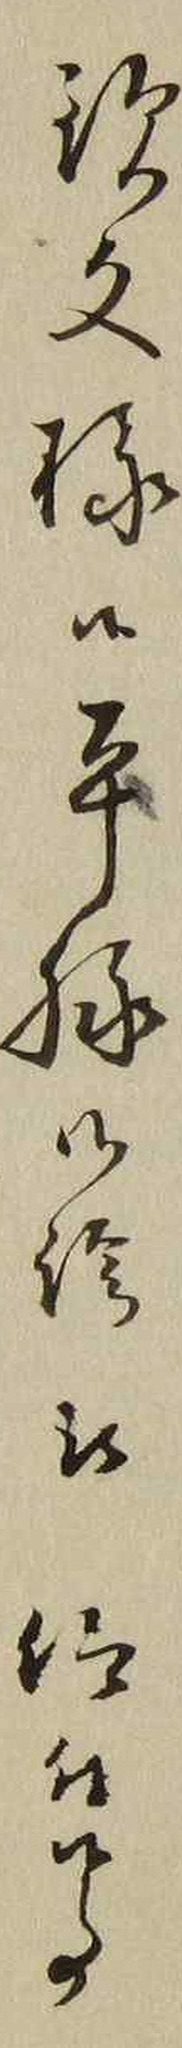欽文様御平様御診被仰付候事
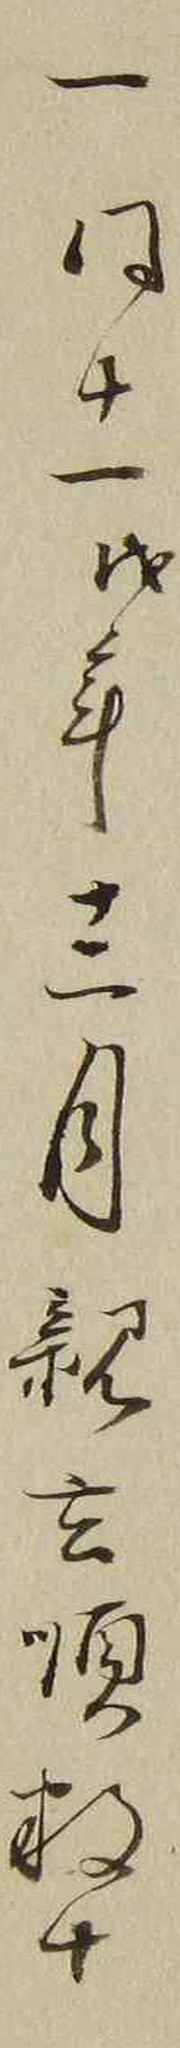一同十一戌年十二月親玄順数十
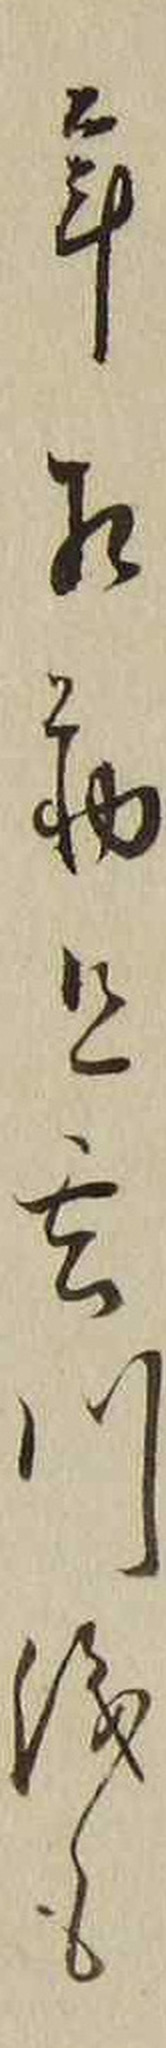年相勤且玄川儀も
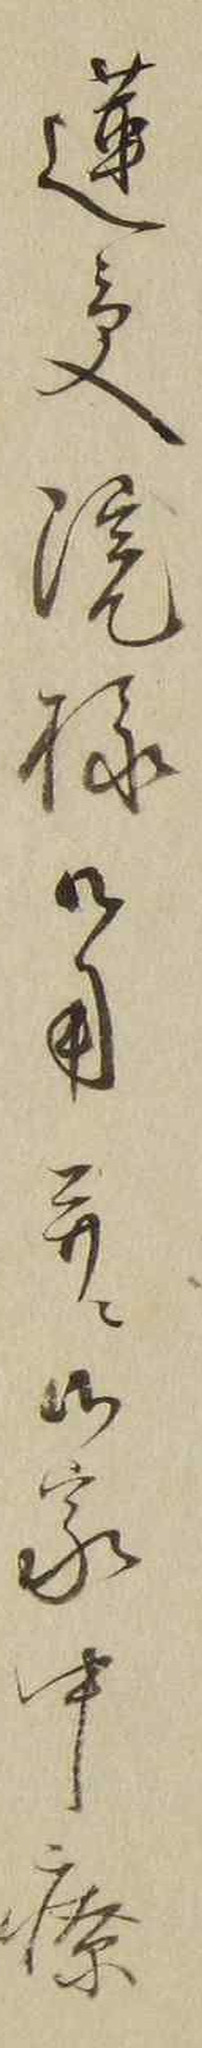蓮受院様御用幷ニ御家中療

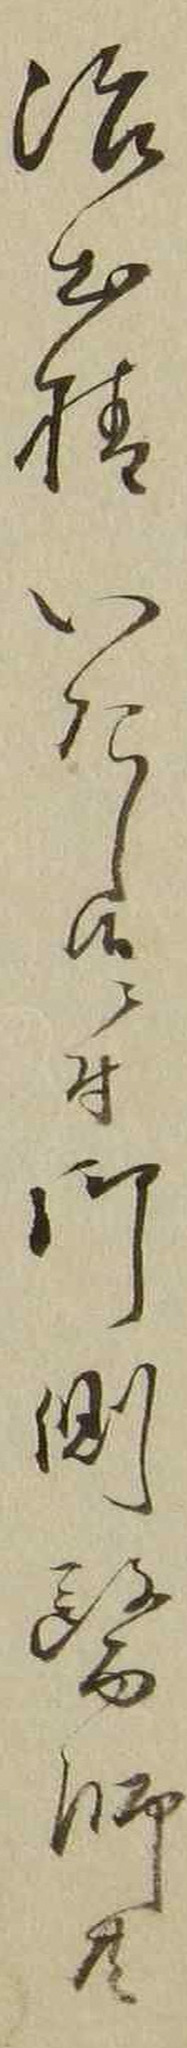治出精いたし候ニ付御側医師共
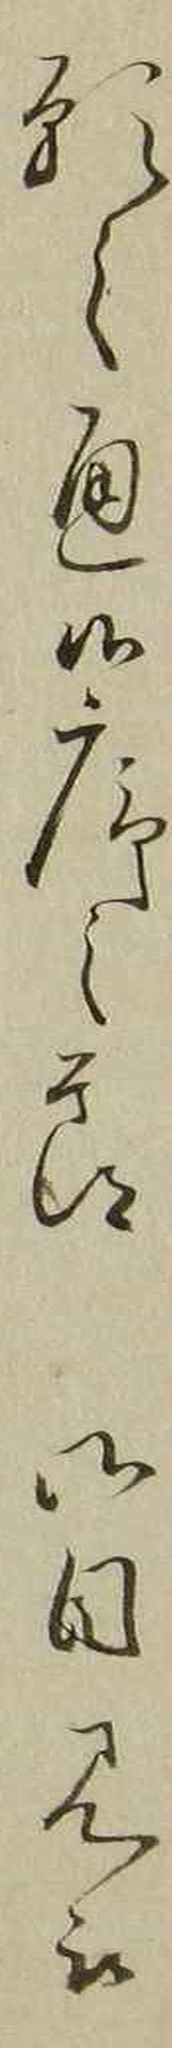願之通御席之節御目見被
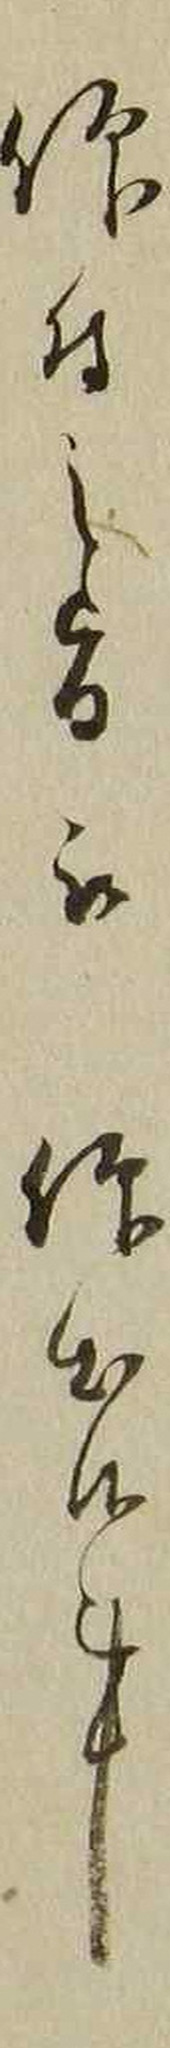仰付之旨被仰出候事
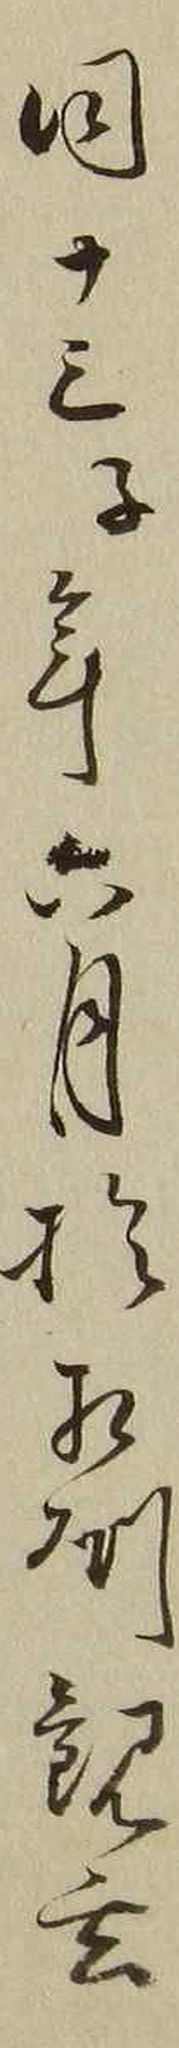同十三子年六月於相州親玄
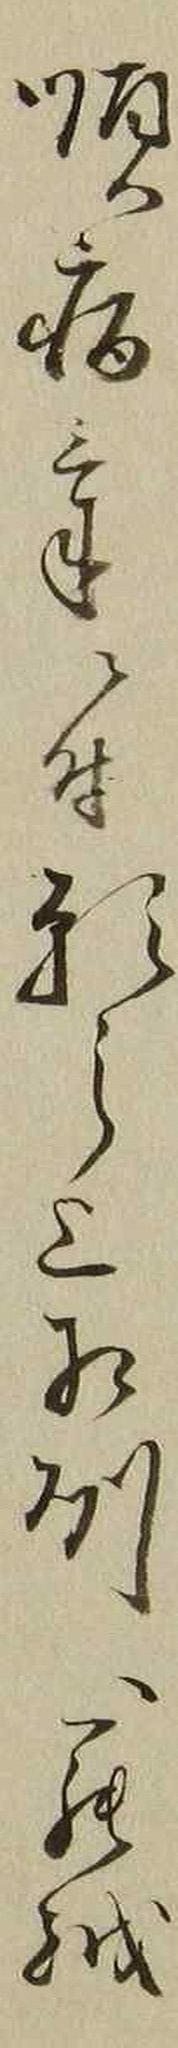順病気ニ付願之上相州へ罷越
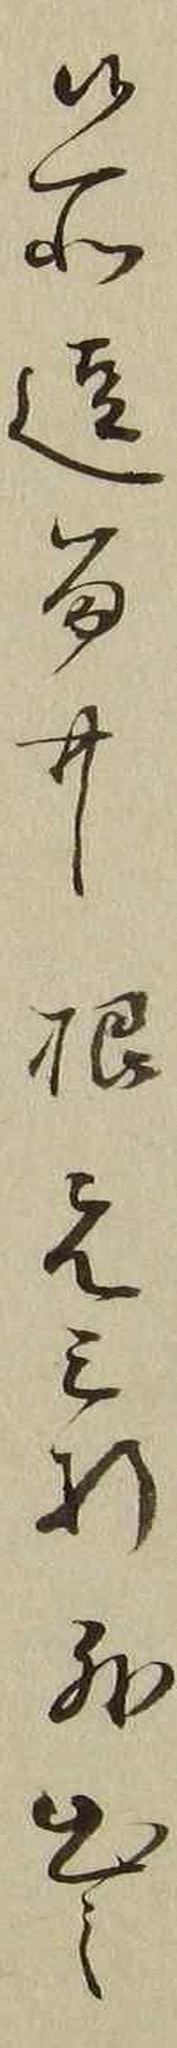候所逗留中根元三軒外出之
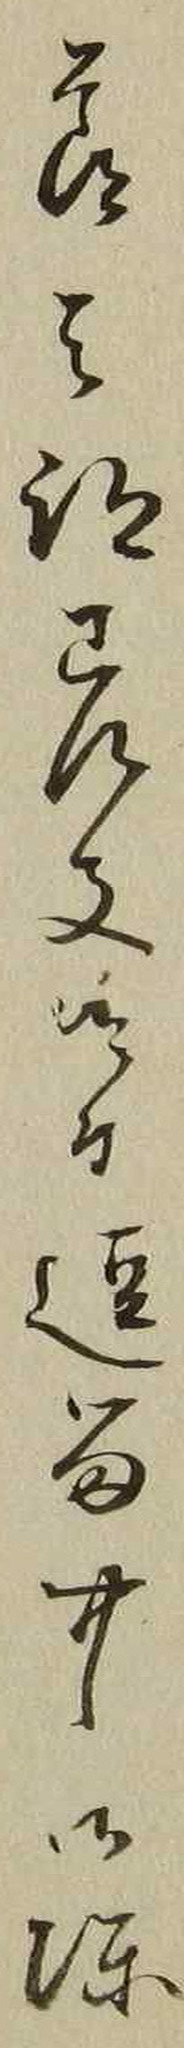節之跡差支候ニ付逗留中御陣
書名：諸士系譜　巻之129　た之部5
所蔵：会津若松市立会津図書館
